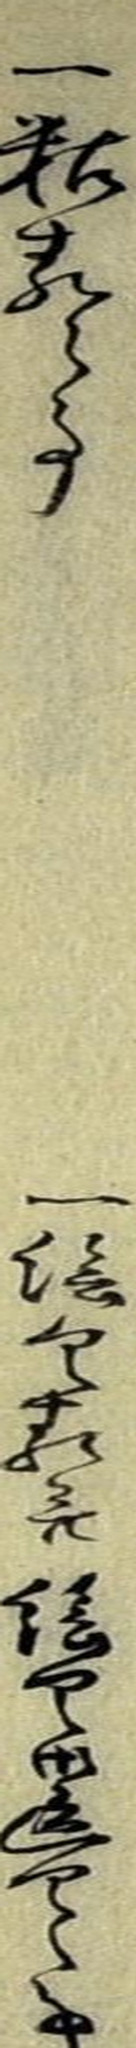一粘類之事一絵具類并絵具御道具之事
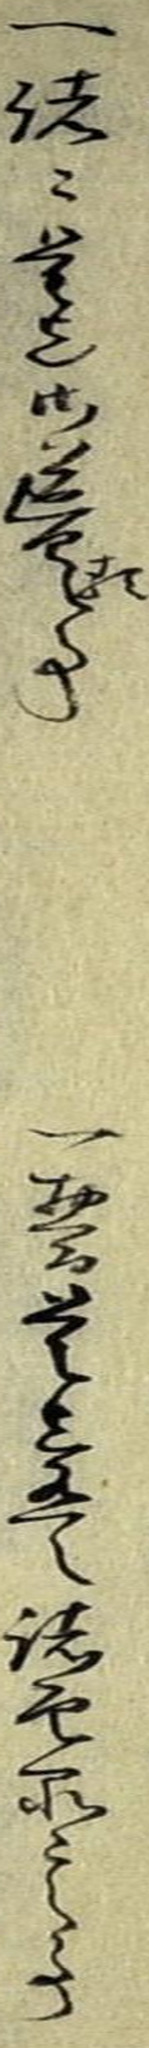一諸々是迄御道具類之事一惣而是迄有之諸色品々之事
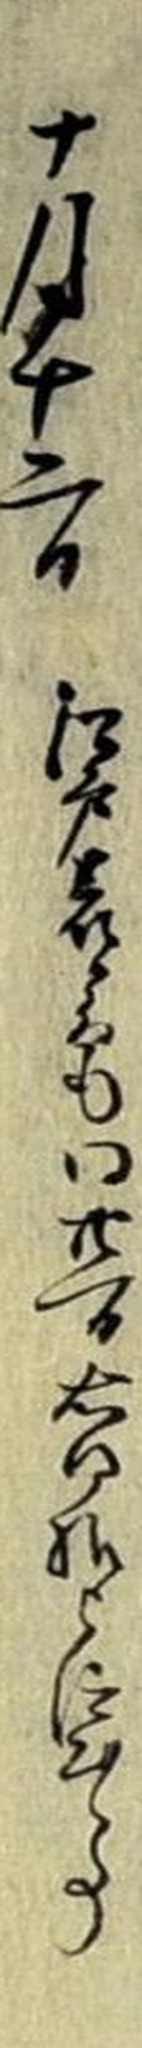十月十二日江戸表に而も同廿一日右同様被仰出事
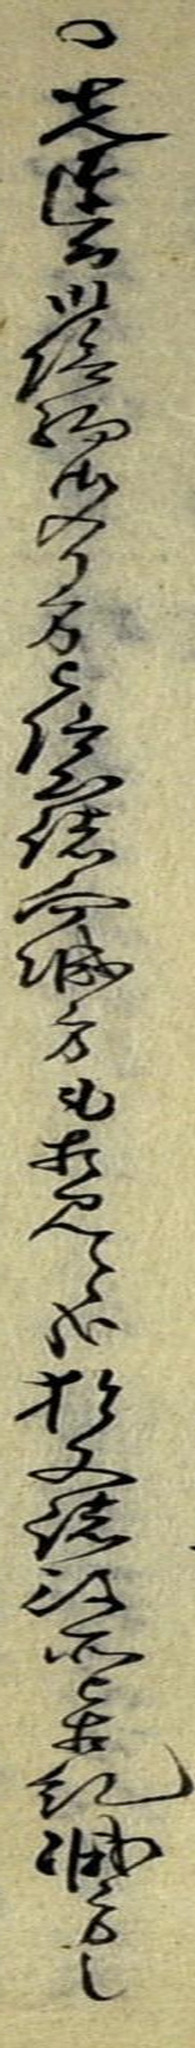〇先達而御倹約御〆り方被仰出諸向減方も相見候哉猶又諸役所被相糺減方之
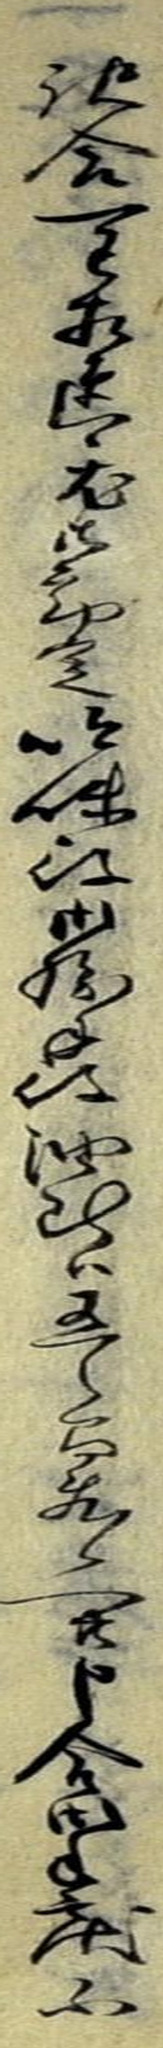訳合可被相達候尤御勘定吟味役御勝手役油断は有之間敷候へ共申合御手戻不
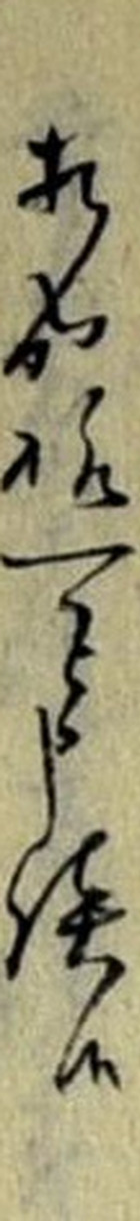相成様可被申談候
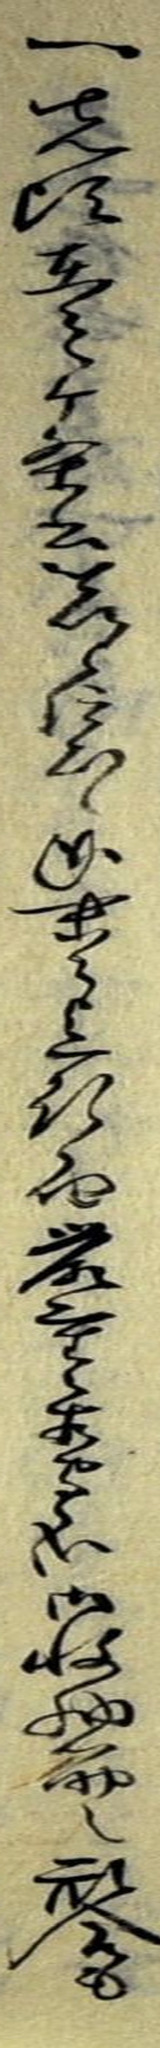一先頃在々ケ条書を以被仰出候趣末々迄行届厳重に相守候哉御収納筋之形合も
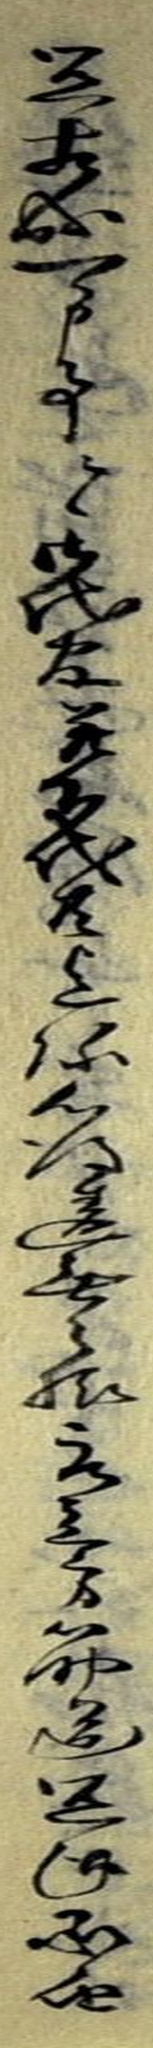宜相成可申事に候御代官并下代共迄弥心得違無之様取立方筋道宜趣承届

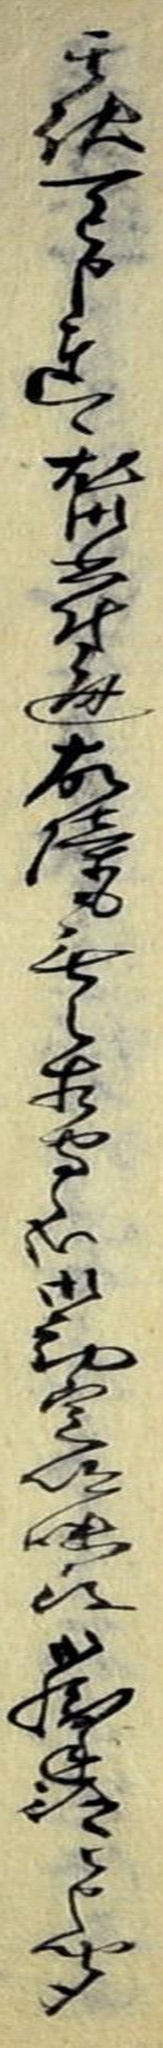其訳可被申達候尤御書付通故障も無之相守候哉御勘定吟味役御勝手役へ被申聞
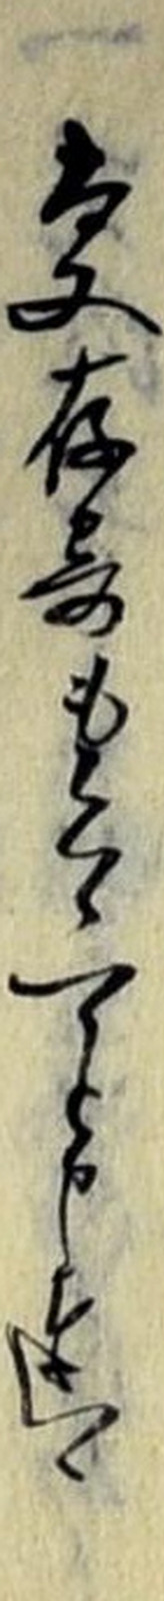尚又存寄も候はゝ可被申達候
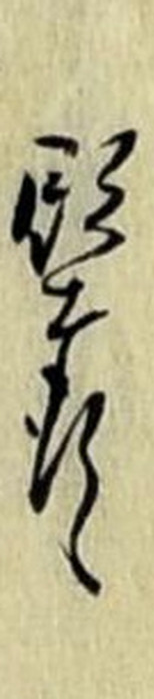郡奉行へ
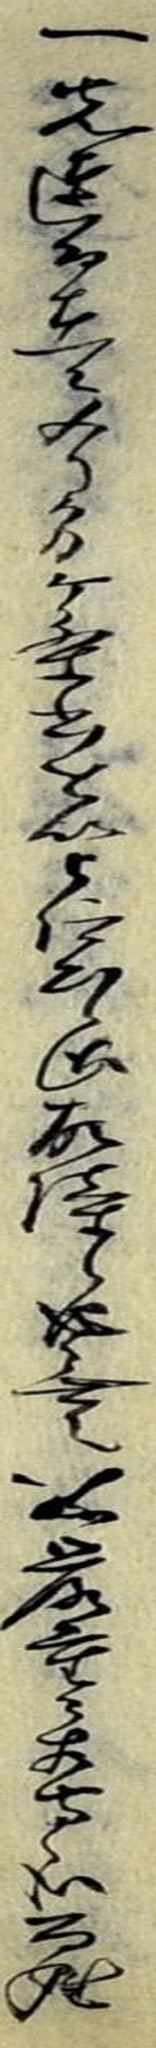一先達而在々〆り方ケ条書を以被仰出候趣故障之儀無之厳重に相守候哉百姓
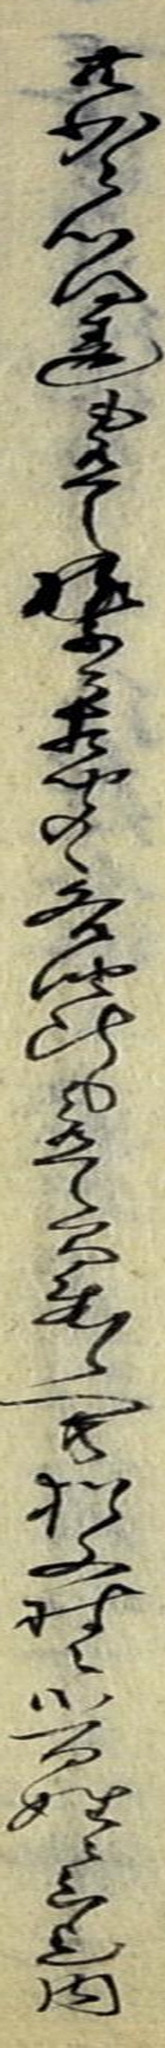共少々心得違も有之様子に相聞候各油断も有之間敷候へ共猶又村々小百姓に至迄内
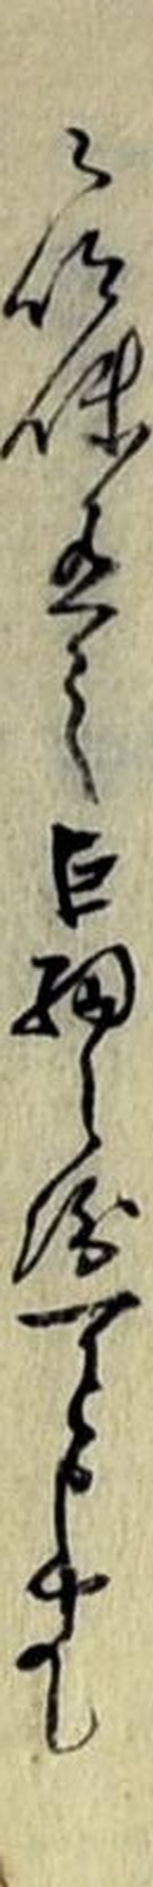々吟味有之巨細之儀可被申聞候
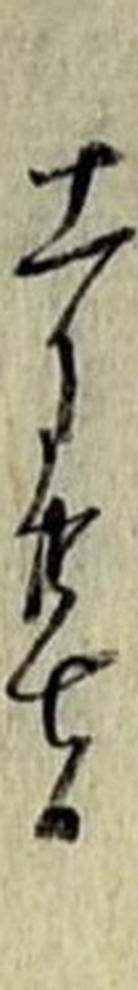十一月廿七日
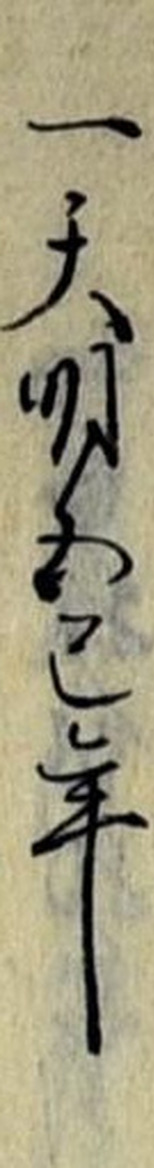一天明五巳年
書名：命令之部 二
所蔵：福井県文書館 Fukui Prefectural Archives
